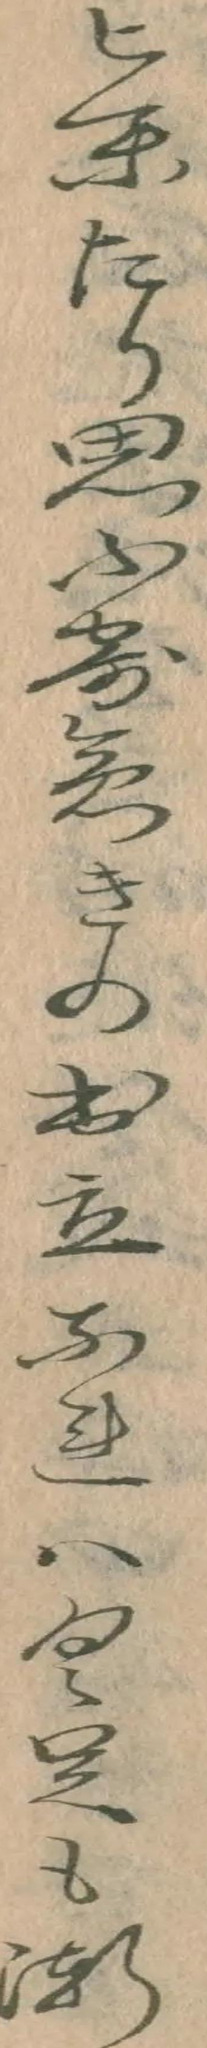被参たり思ふ寄急きの出立な連は具足も漸
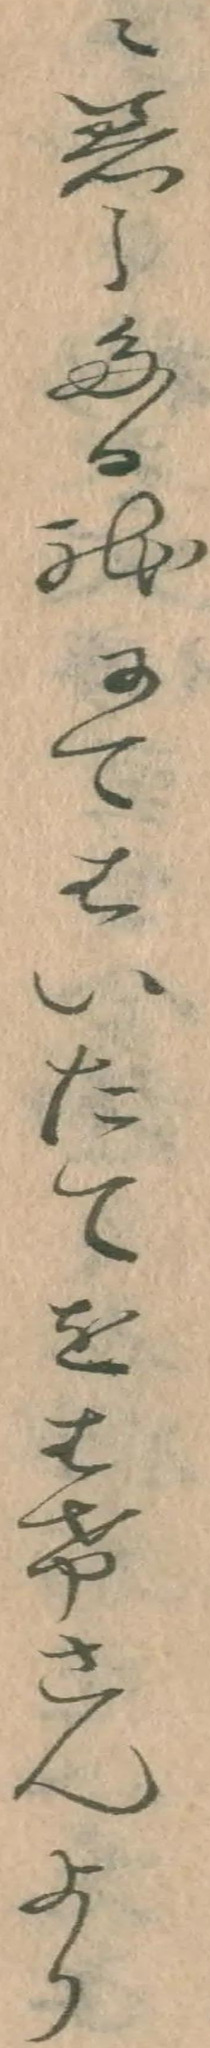々着し多る躰尓て者いたてを者希さんより
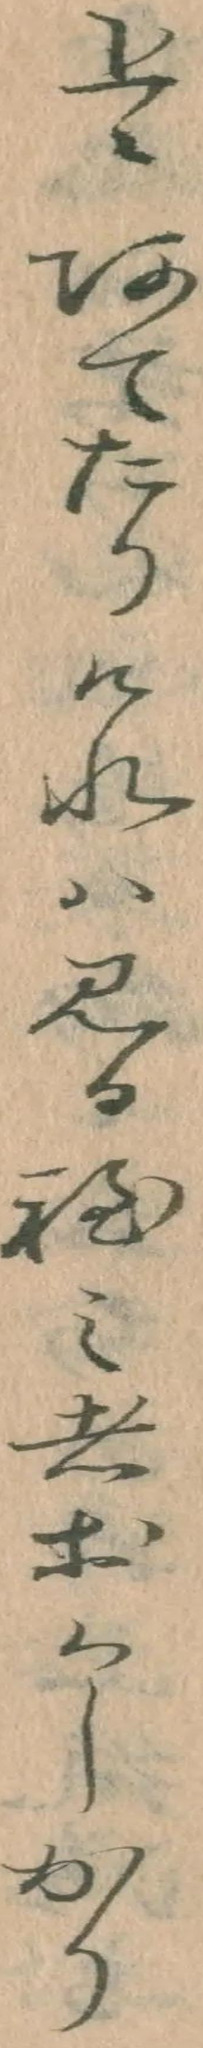上に阿てたりけれは見る程之者等かしかり
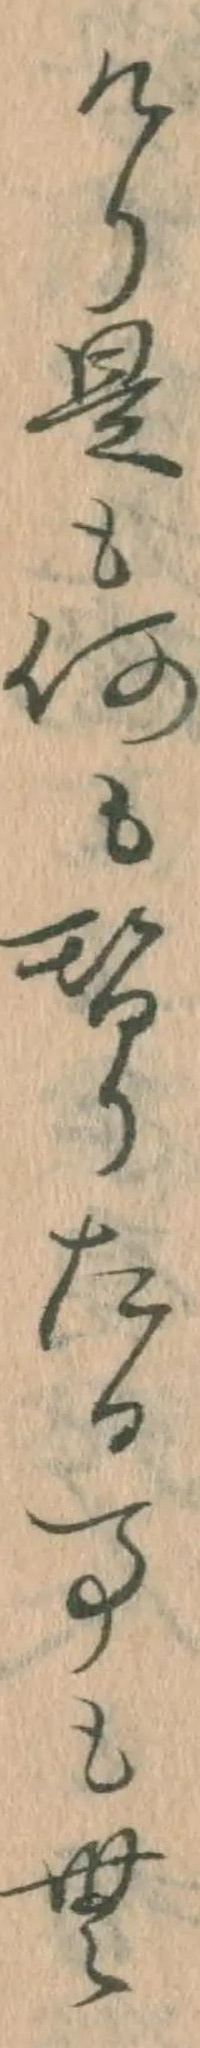けり是も何も替りたる事も無
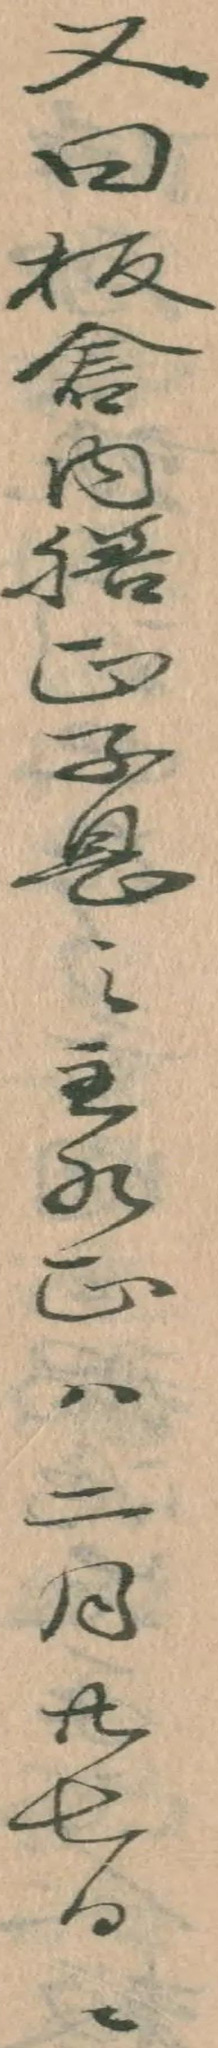又曰板倉内膳正子息之主水正は二月廿七日に
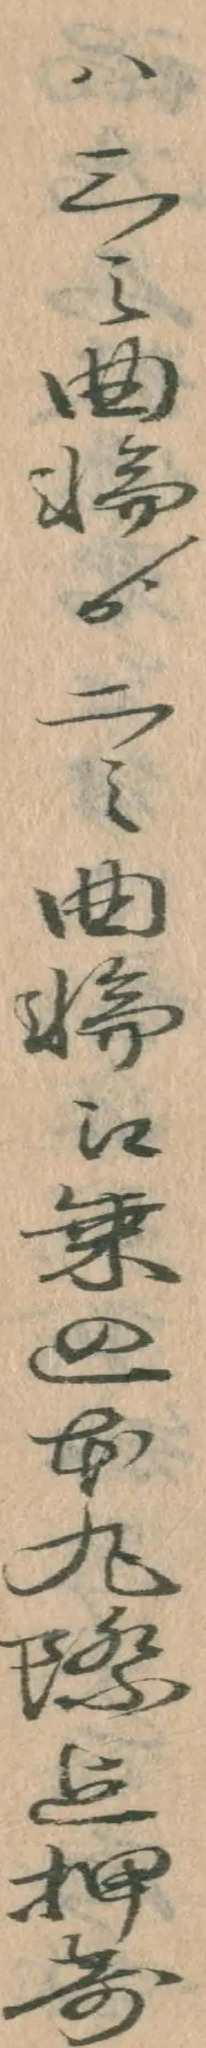は三之曲輪ゟ二之曲輪江乗込本丸際迄押寄
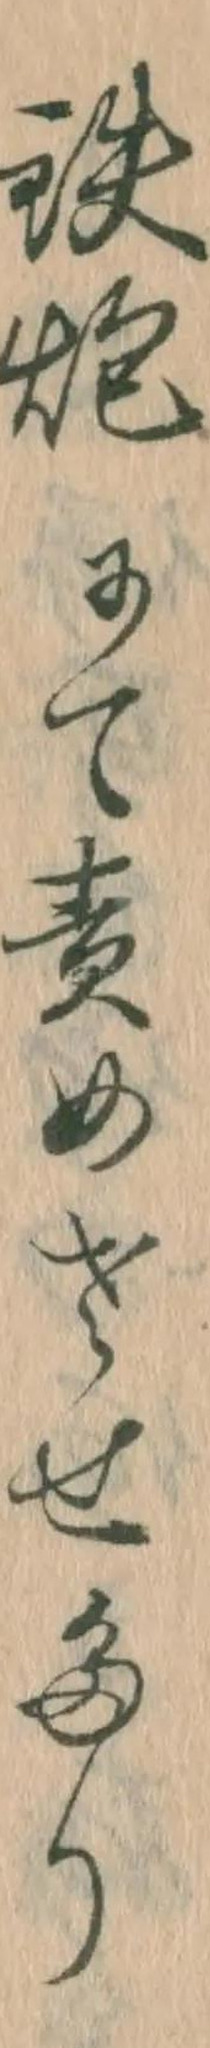鉄砲尓て責めさせ多り
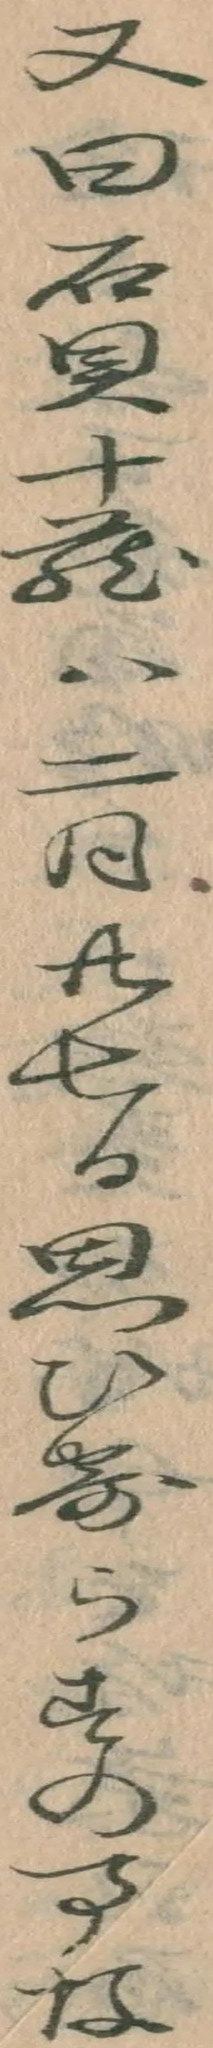又曰石貝十蔵は二月廿七日思ひ寄ら春の事な
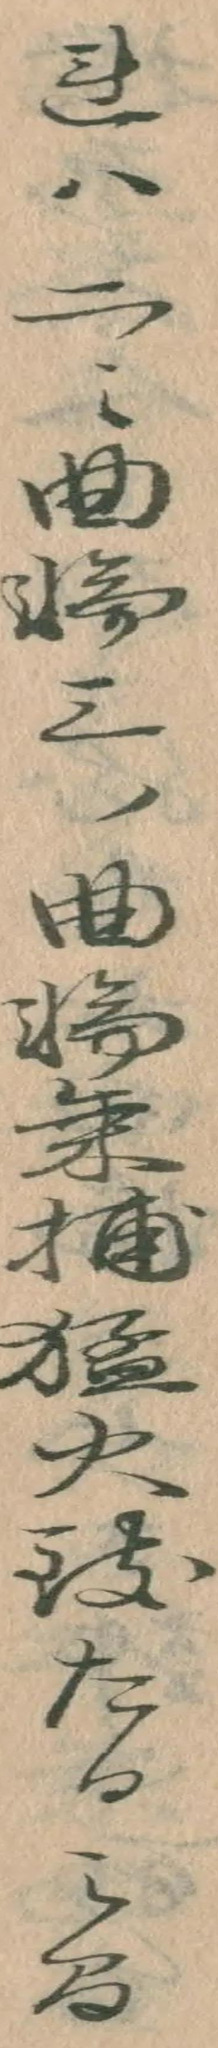連は二之曲輪三之曲輪乗捕猛火致たる之間
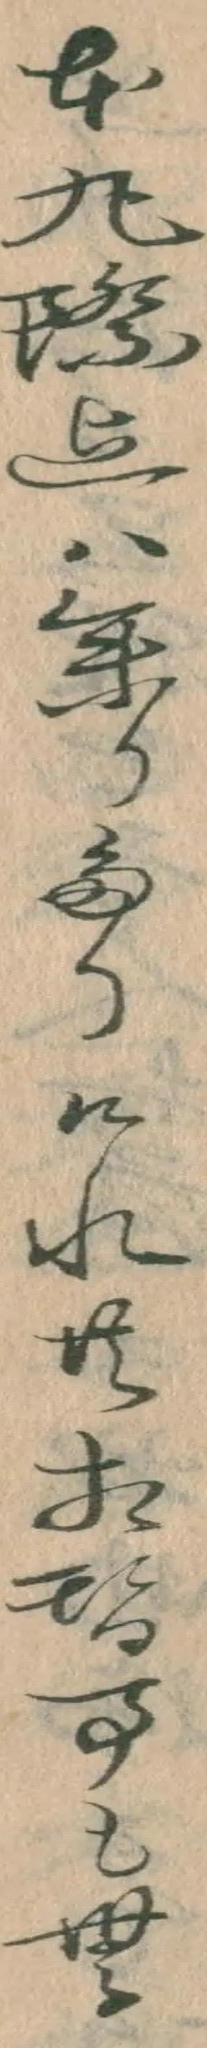本丸際迄は参り多りけれ共相替事も無
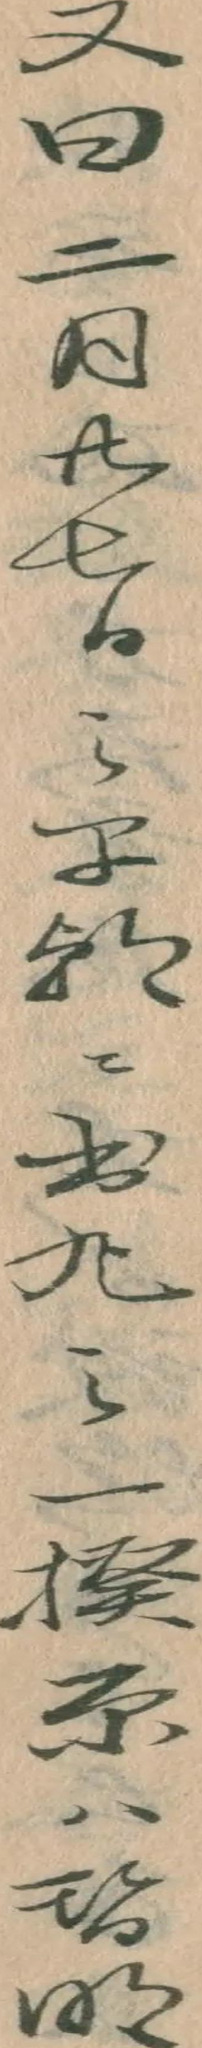又曰二月廿七日之早朝に出丸之一揆原は替明
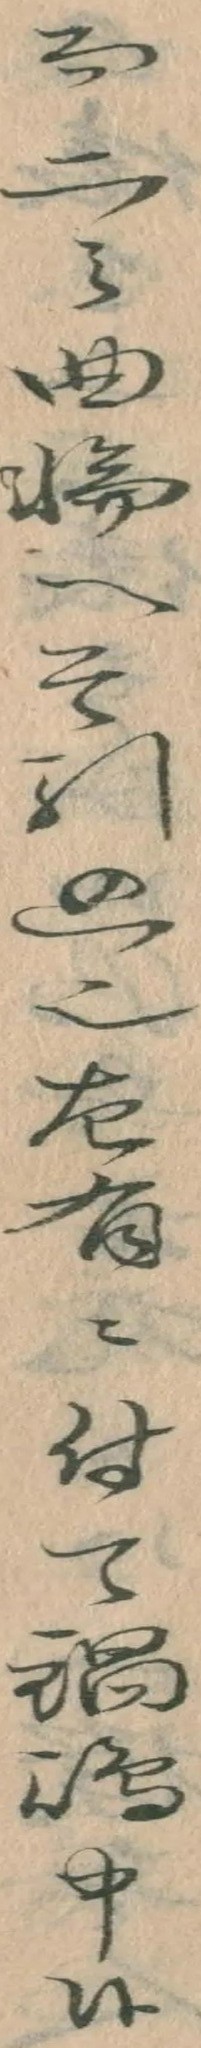而二之曲輪へそ引込也左有に付て鍋島申候
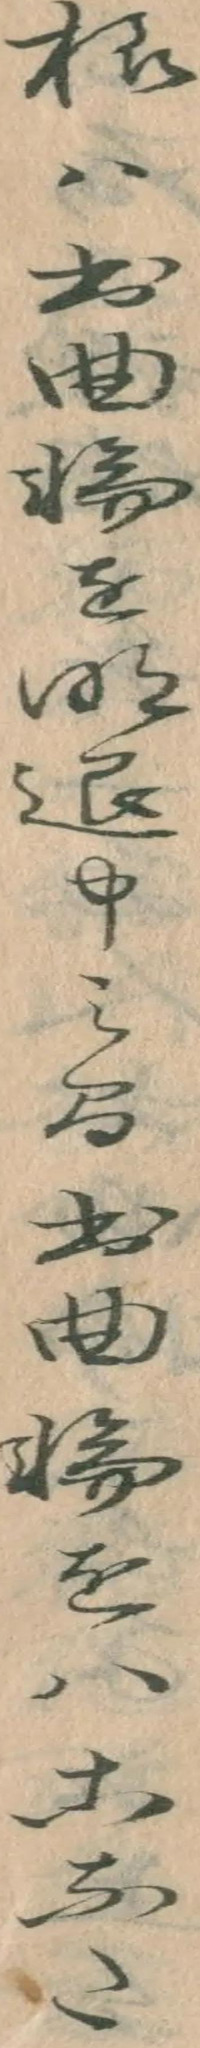様は出曲輪を明退申之間出曲輪をは古なた
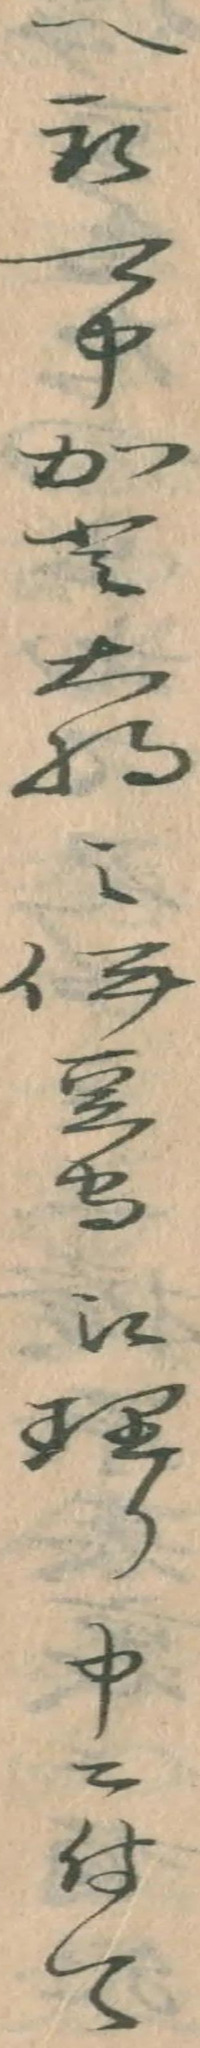へ取可申加登大将之伊豆守江理り申に付て足

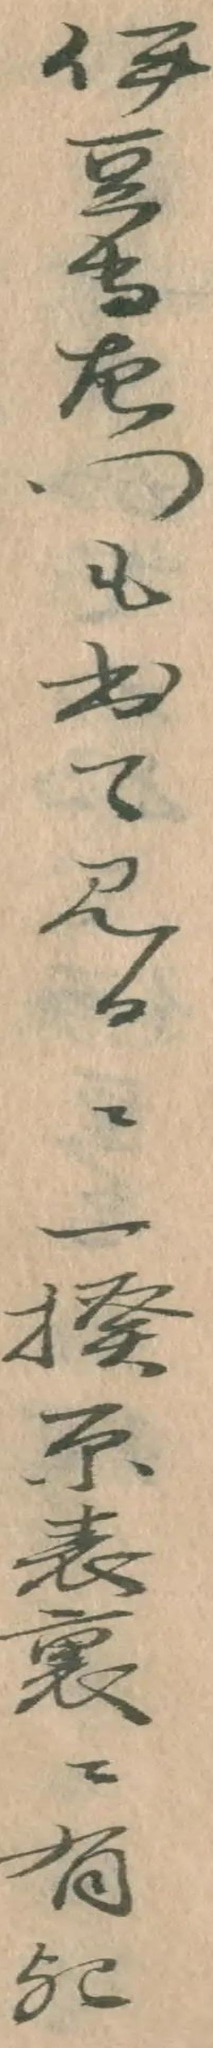伊豆守左門も出て見るに一揆原表裏に有歟
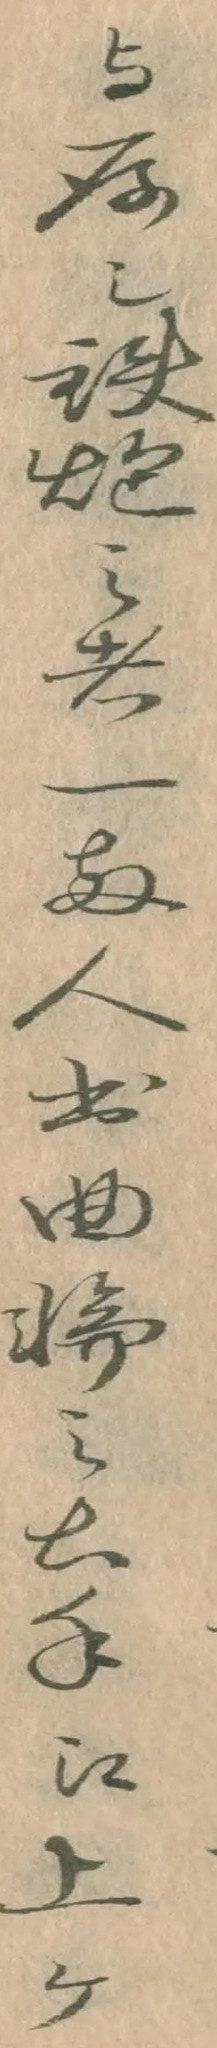与存し鉄砲之者一両人出曲輪之土手江上け
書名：切支丹御退治記 49巻. [8]
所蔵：国立国会図書館 National Diet Library, JAPAN
